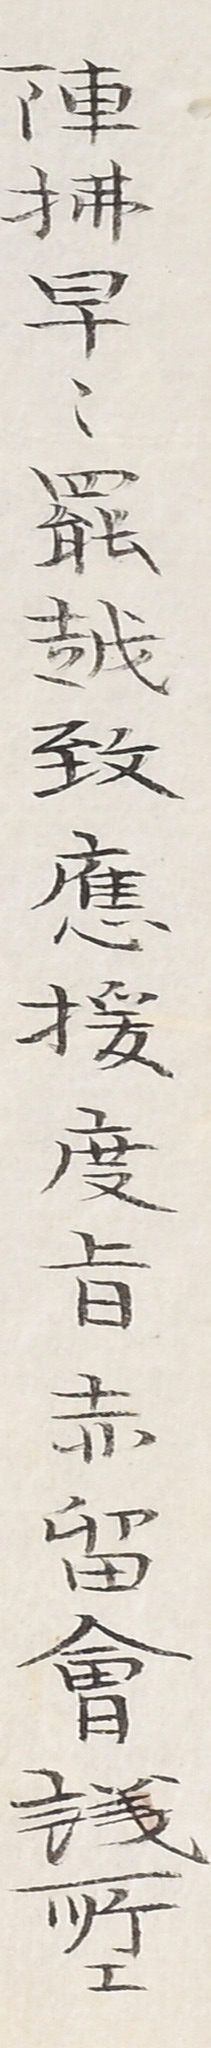陣払早々罷越致応援度旨赤留会議所エ
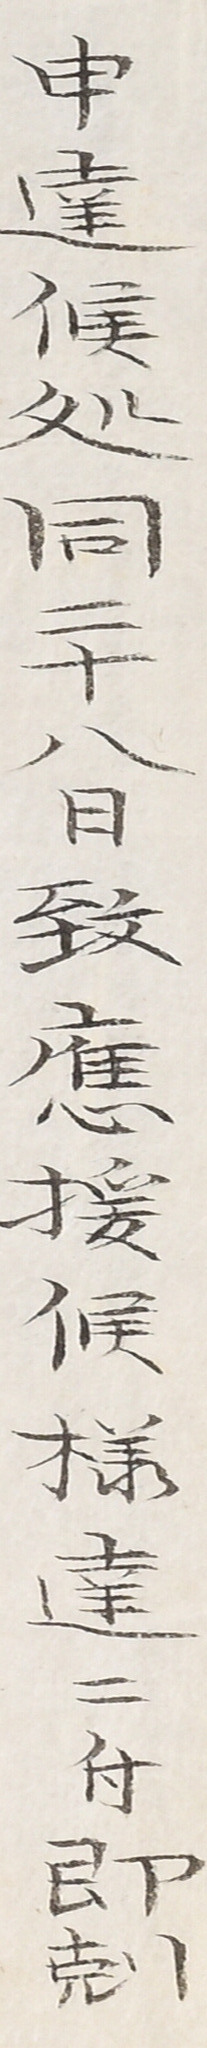申達候処同二十八日致応援候様達ニ付即剋
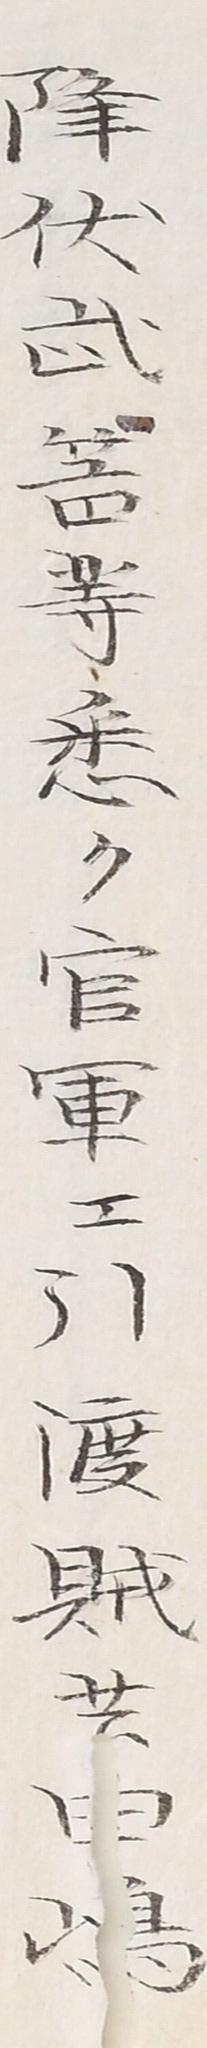降伏武器等悉ク官軍エ引渡賊共田嶋
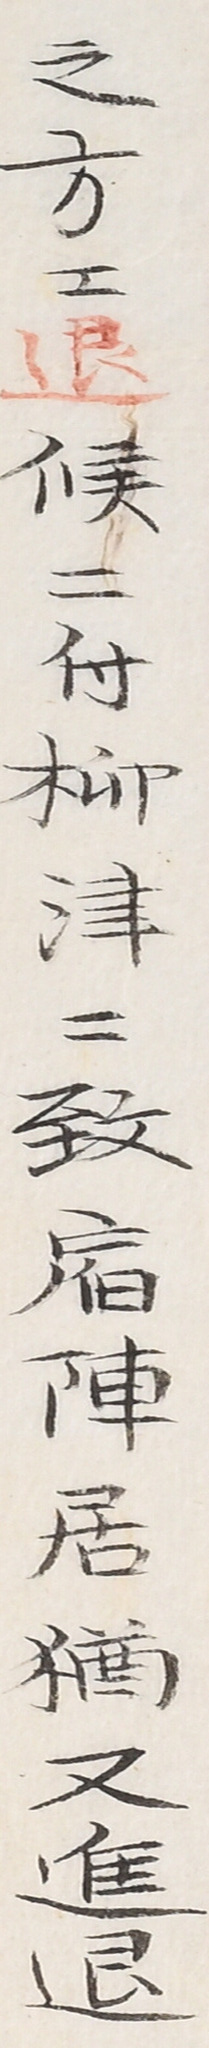之方エ候ニ付柳津ニ致宿陣居猶又進退
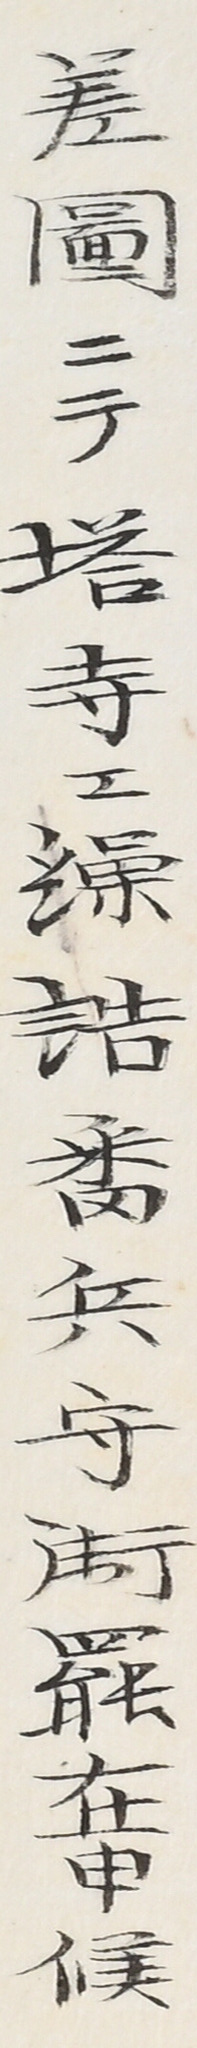差図ニテ塔寺エ繰詰番兵守衛罷在申候
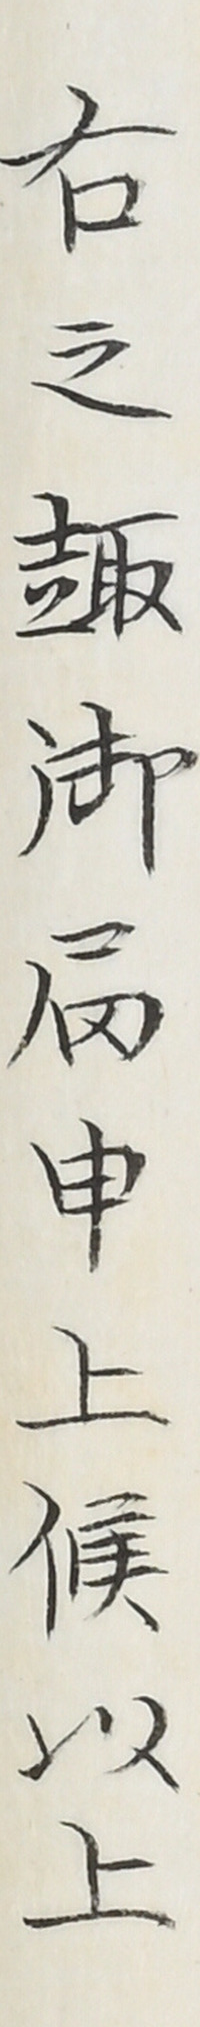右之趣御届申上候以上
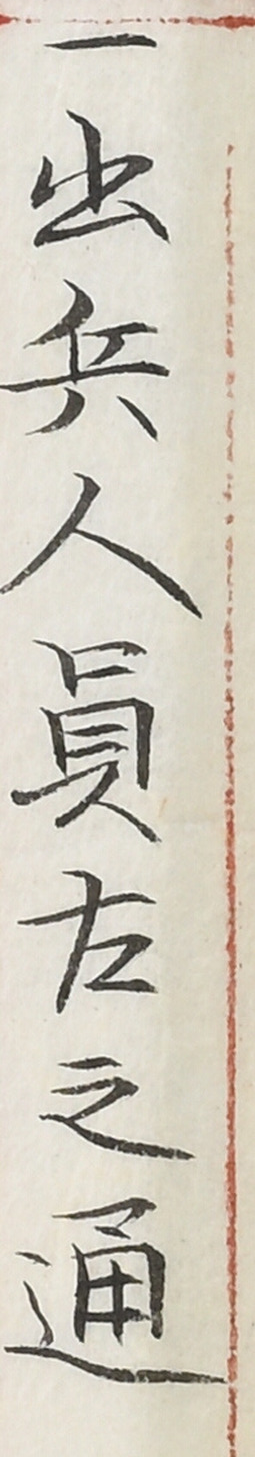一出兵人員左之通

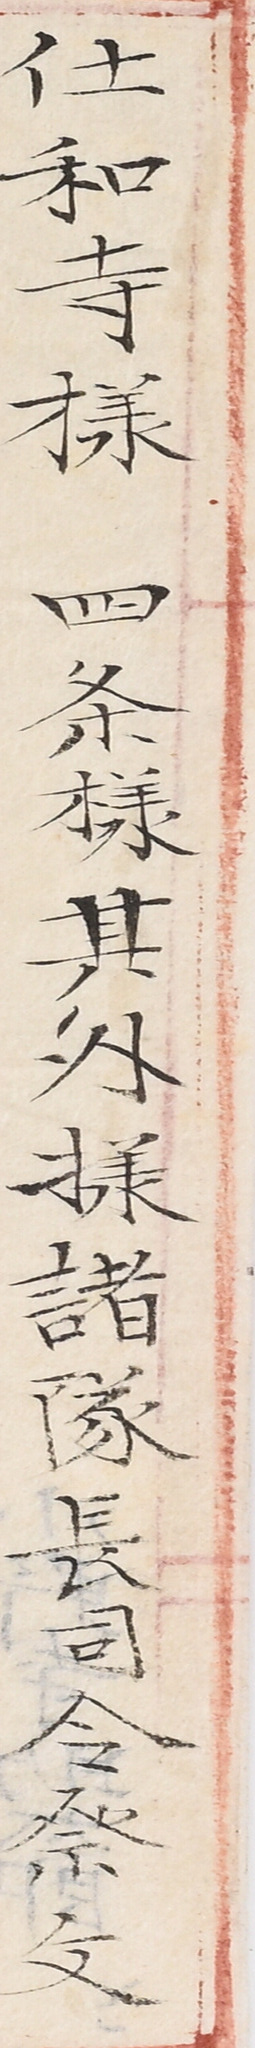仕和寺様四条様其外様諸隊長司令祭文

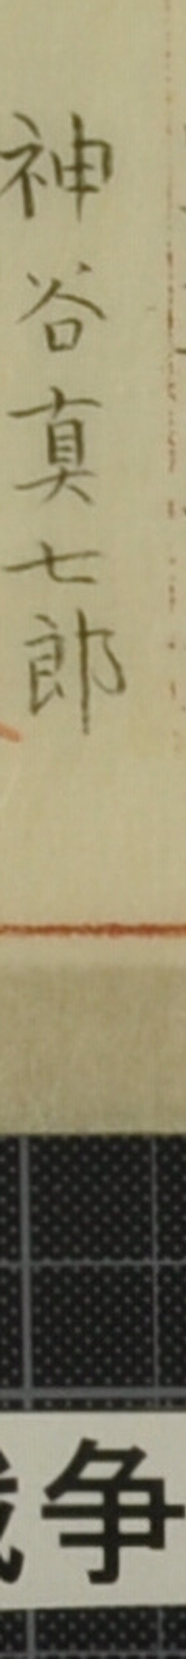同神谷真七郎
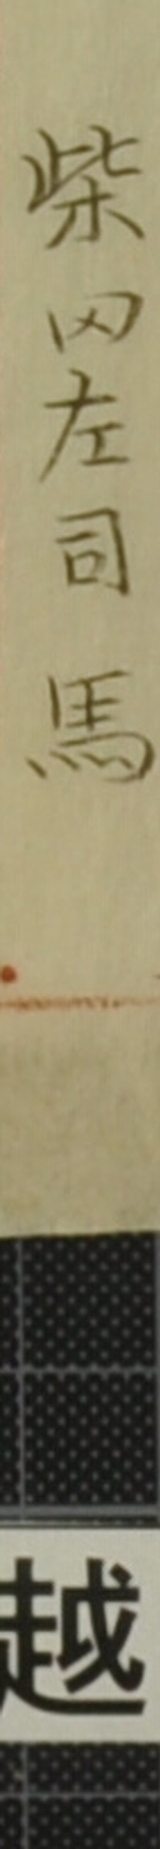同柴田左司馬
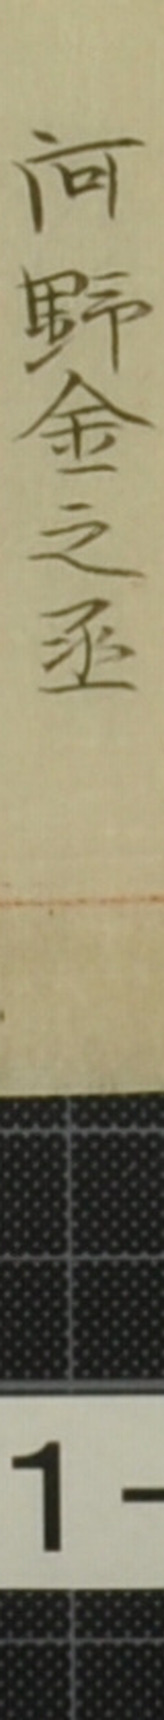同河野金之丞
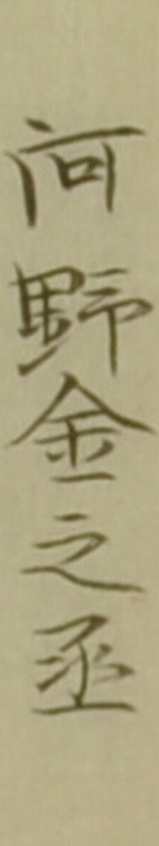同河野金之丞
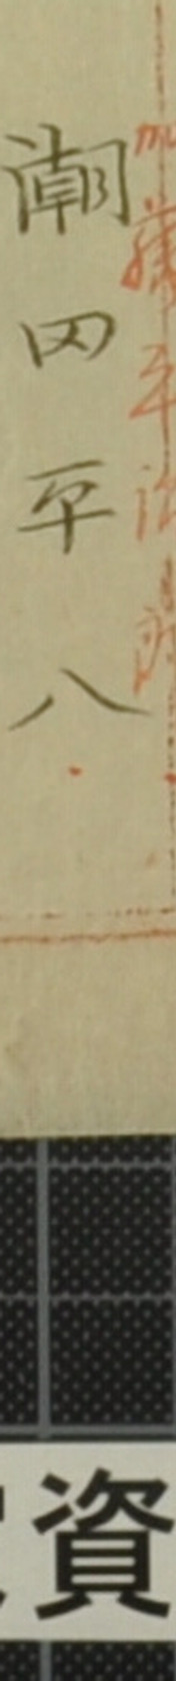潮田平八・
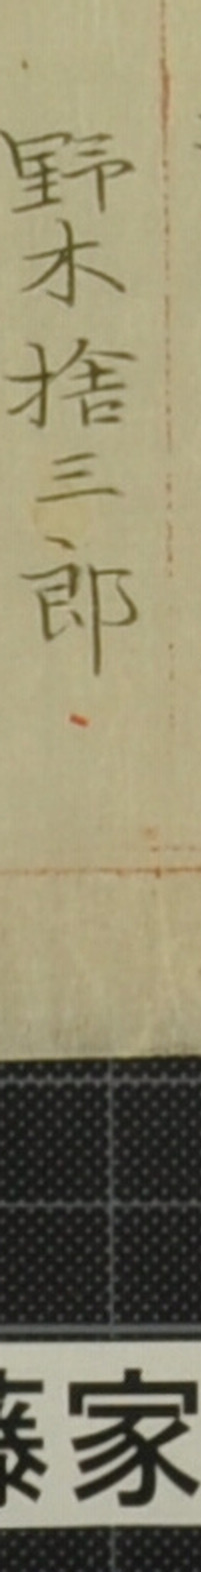野木捨三郎・
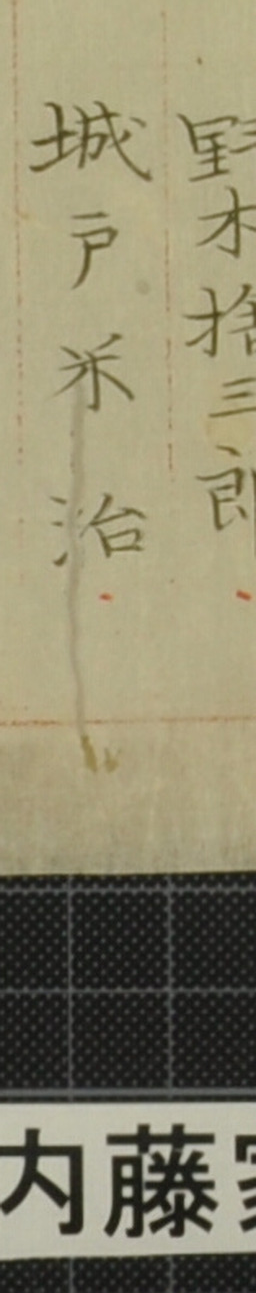城戸米治・
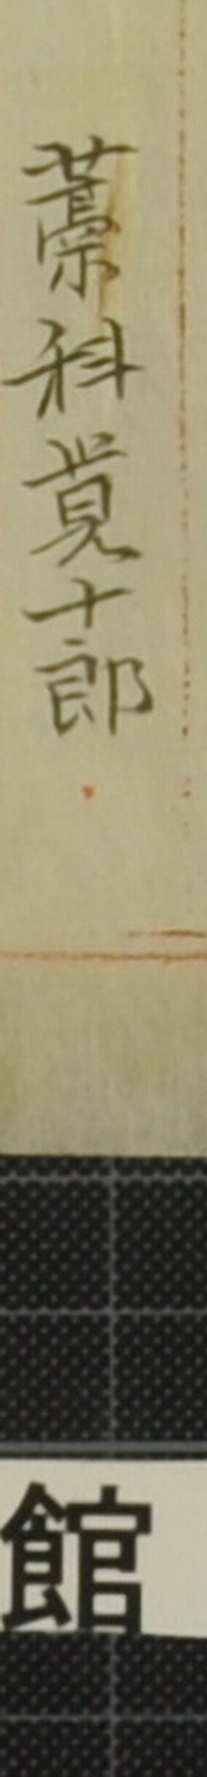藁科覚十郎・
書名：奥越出兵中戦争之事件概略抄録（控）
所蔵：伊那市立高遠町図書館・合同会社AMANE
